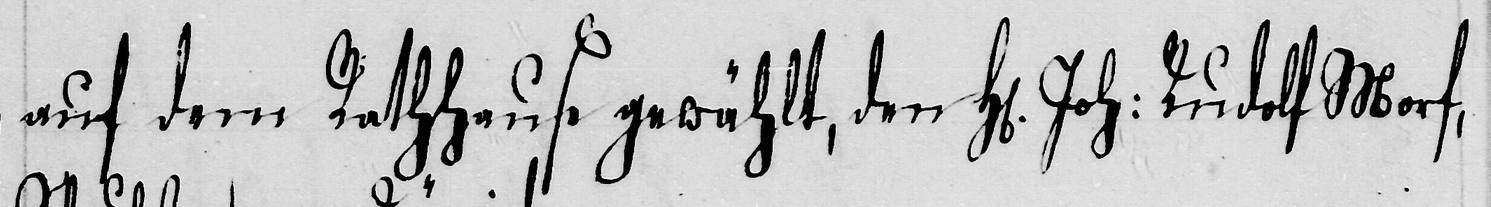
auf dem Rathhause gewählt, den H[en]. Joh: Rudolf
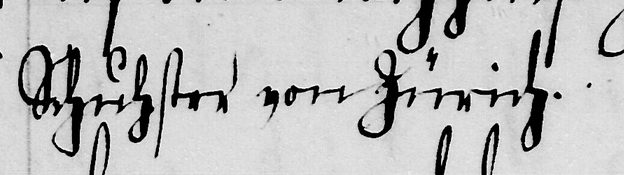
Schuhster von Zürich.
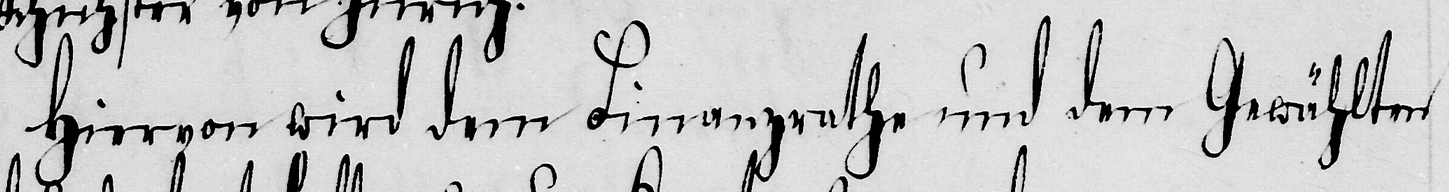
Hiervon wird dem Finanzrathe und dem Gewählten
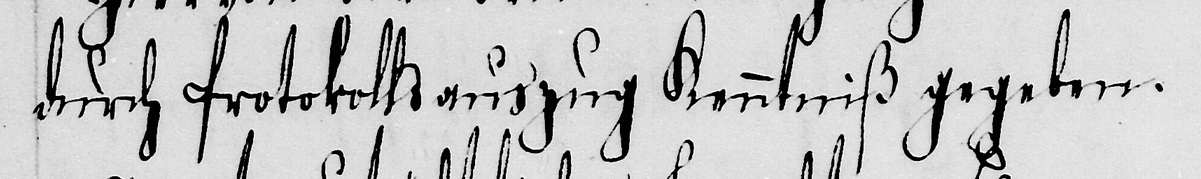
durch Protokollsauszug Kenntniß gegeben.
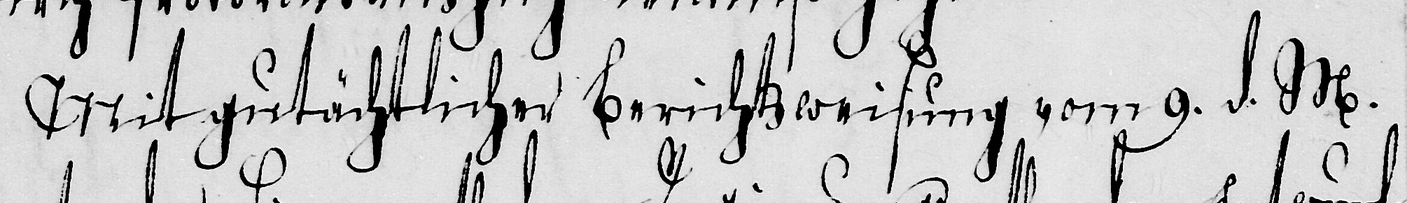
Mit gutächtlicher Berichtsweisung vom 9. d. M.
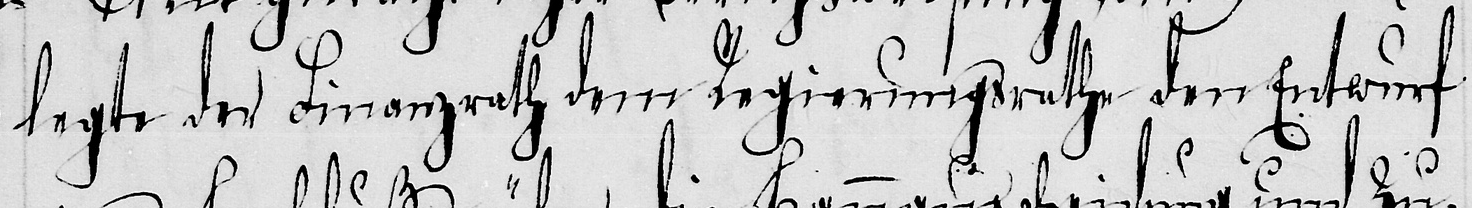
legte der Finanzrath dem Regierungsrathe den Entwurf
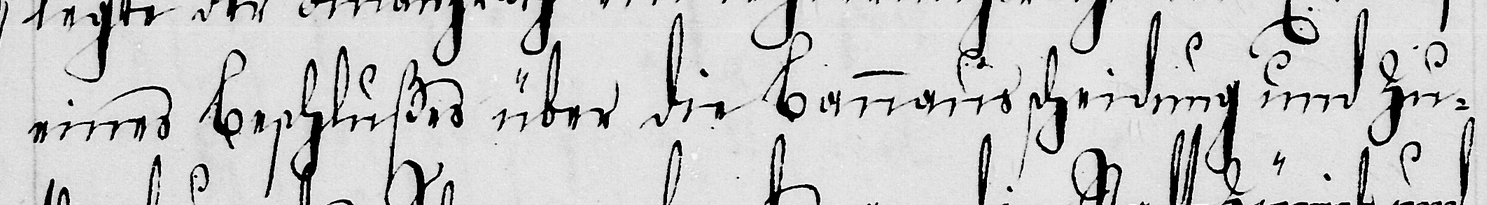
eines Beschlußes über die Bannausscheidung und Zu¬
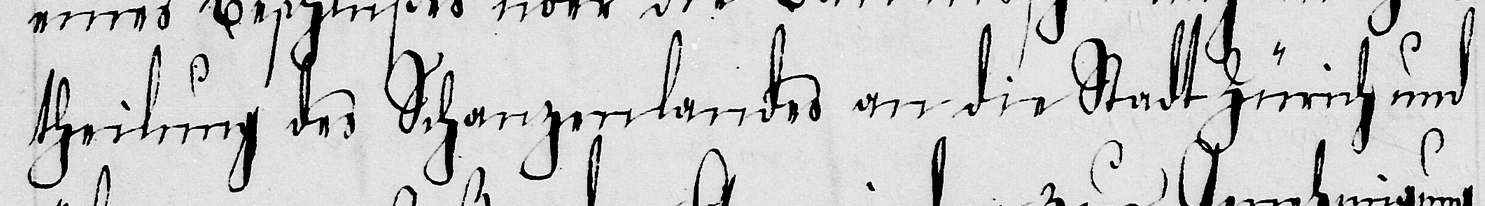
theilung des Schanzenlandes an die Stadt Zürich und
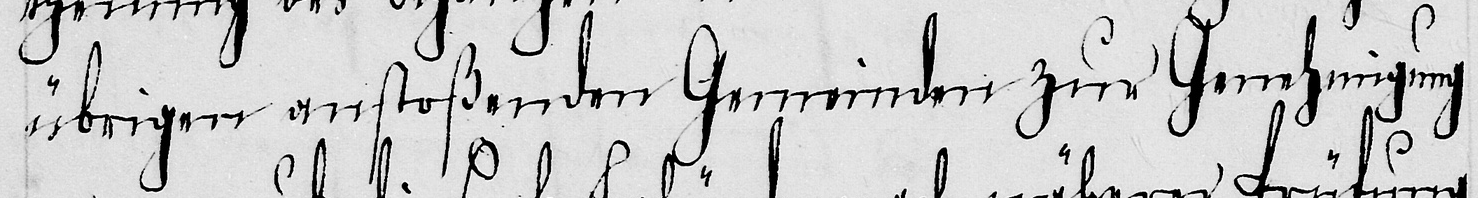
übrigen anstoßenden Gemeinden zur Genehmigung
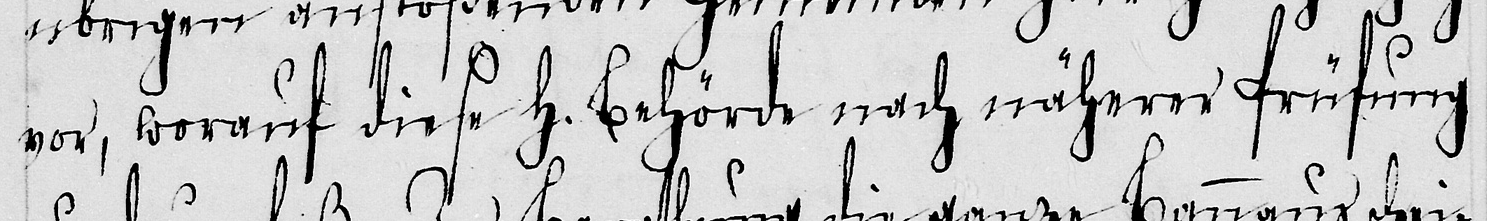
vor, worauf diese h. Behörde nach näherer Prüfung
